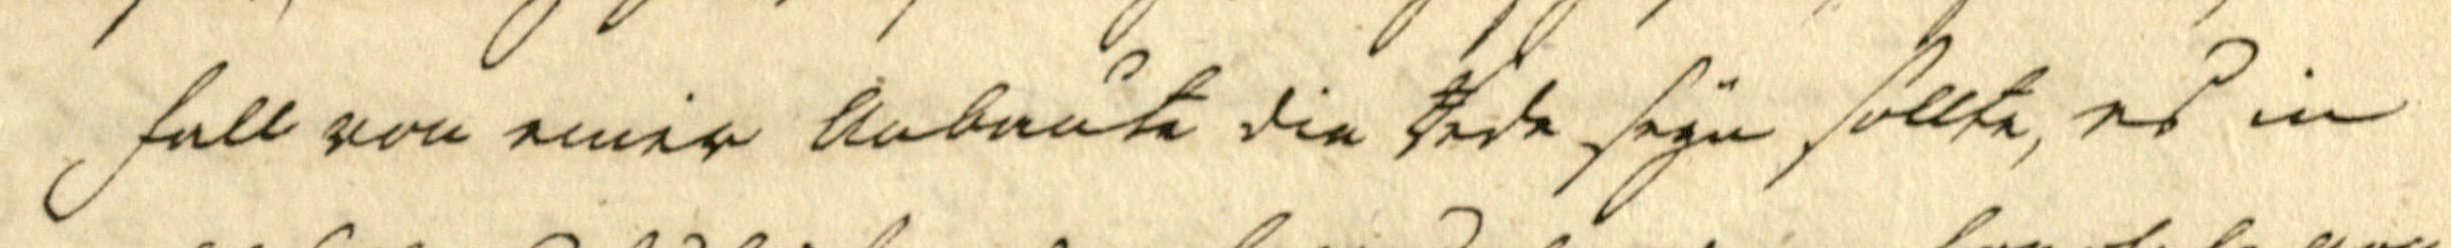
Fall von einer Anbaute die Rede seÿn sollte, es in
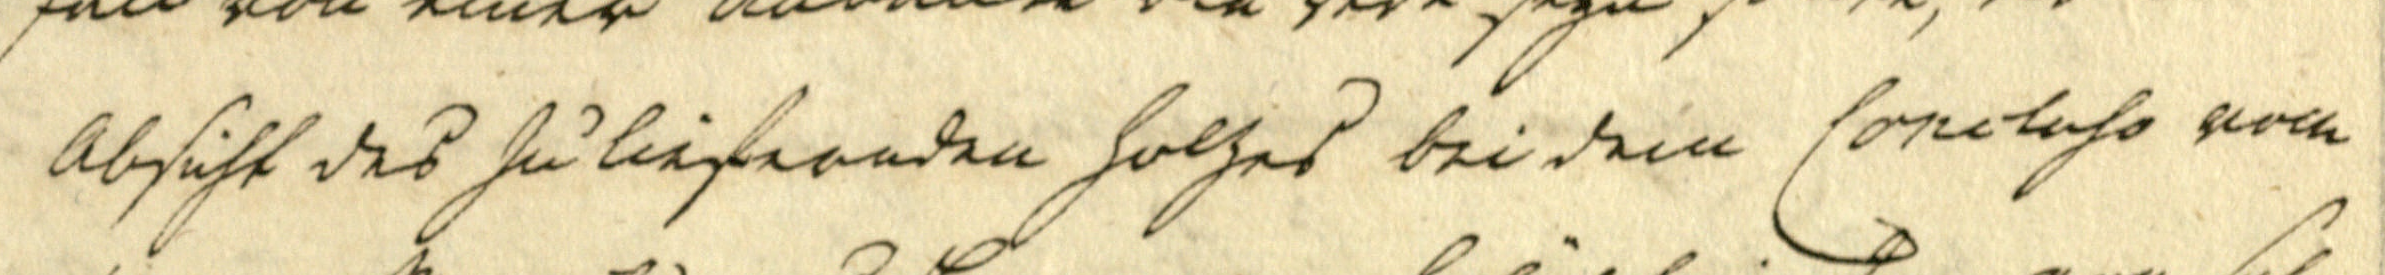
Absicht des zu liefernden Holzes bei dem Concluso vom
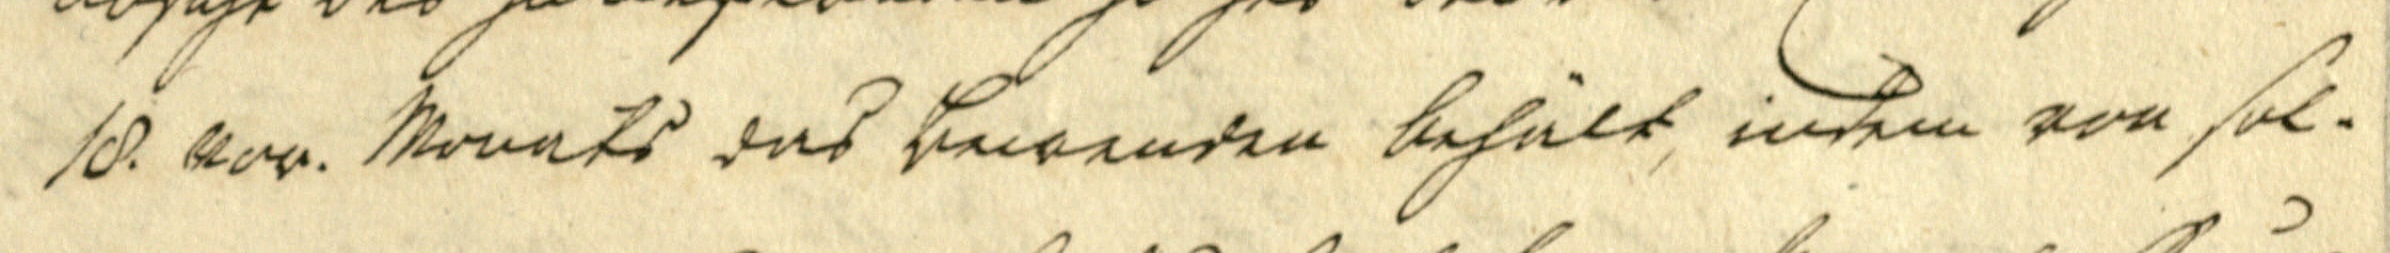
18. vor. Monats das Bewenden behält, indem von sol¬
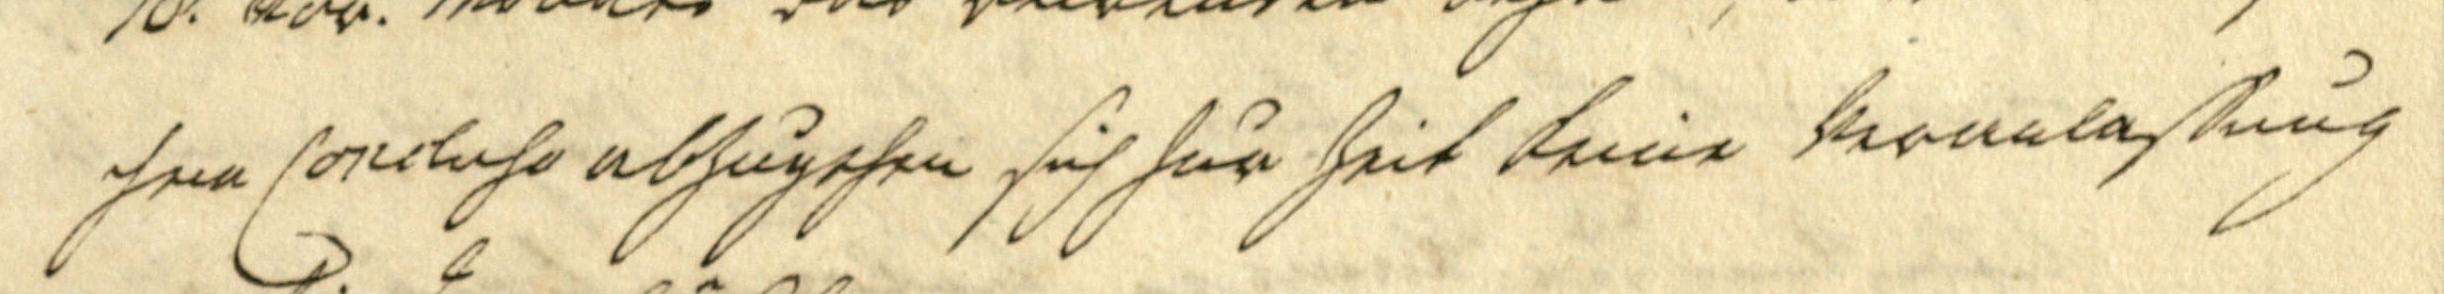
chem Concluso abzugehen sich zur Zeit keine Veranlassung
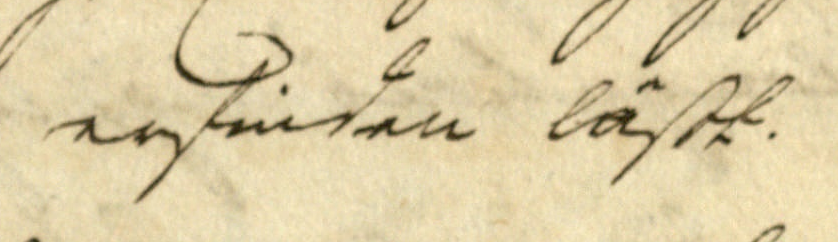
erfinden läßt.
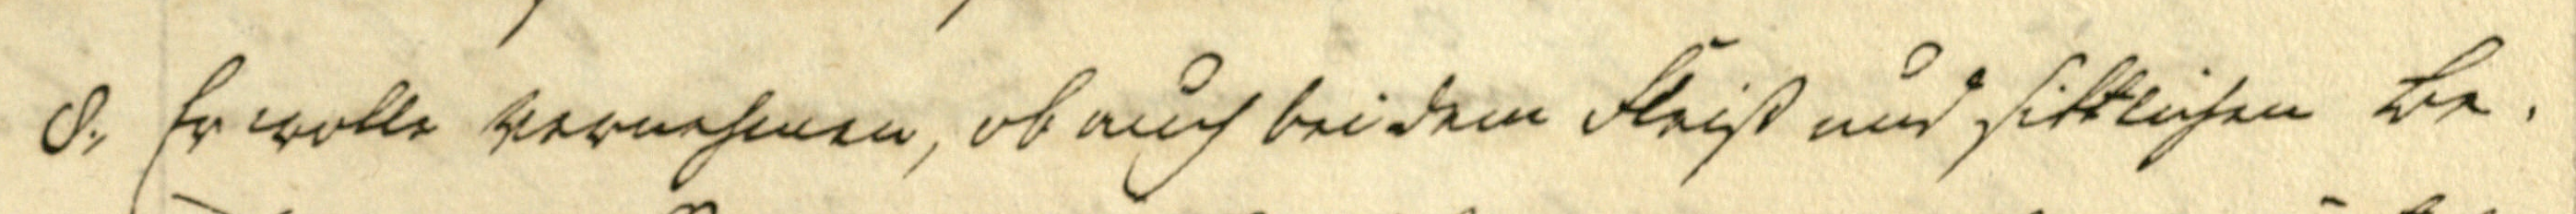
8., Er wolle vernehmen, ob auch bei dem Fleiß und sittlichen Be¬
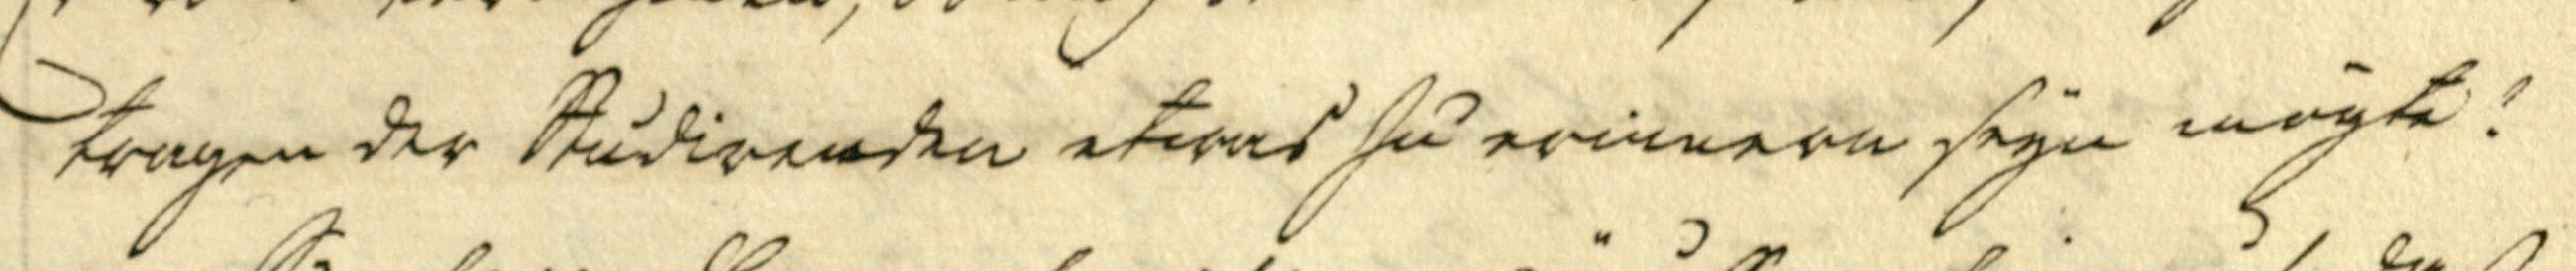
tragen der Studirenden etwas zu erinnern seÿn mögte?
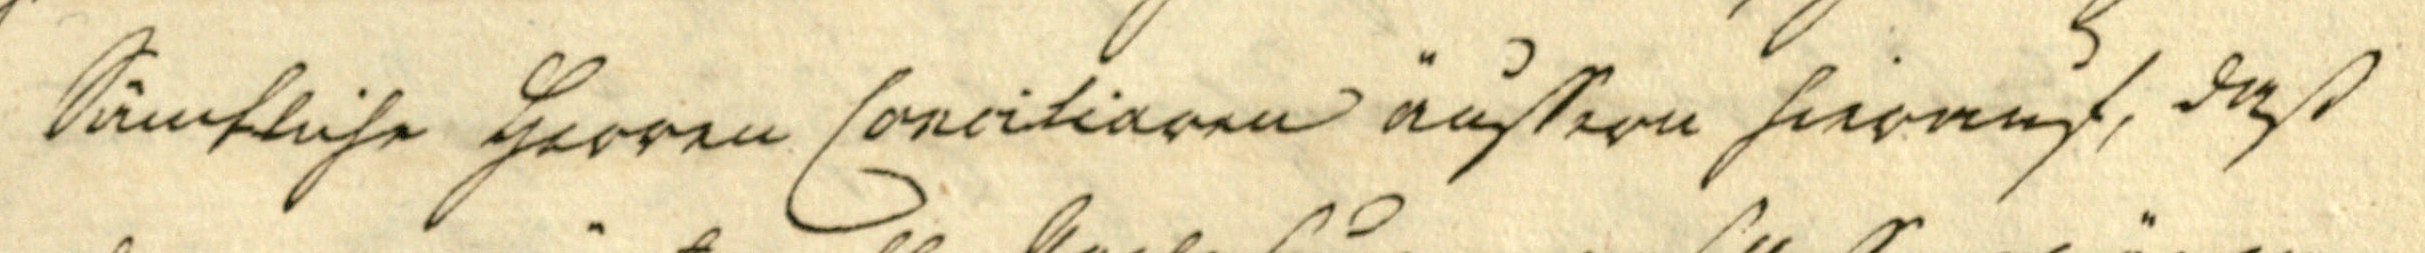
Sämtliche Herren Conciliaren äussern hierauf, daß
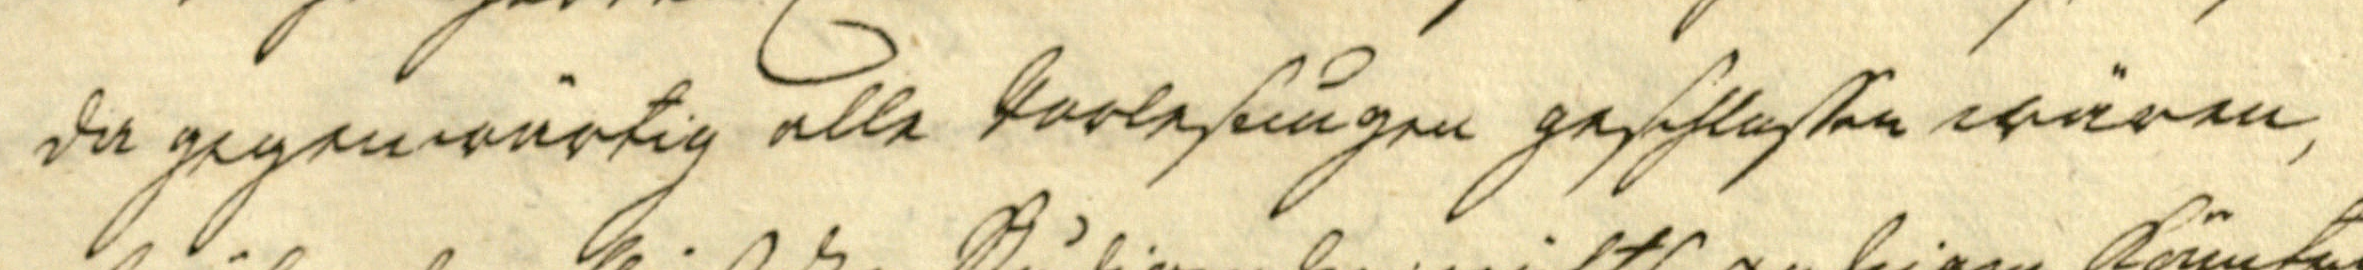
da gegenwärtig alle Vorlesungen geschlossen wären,
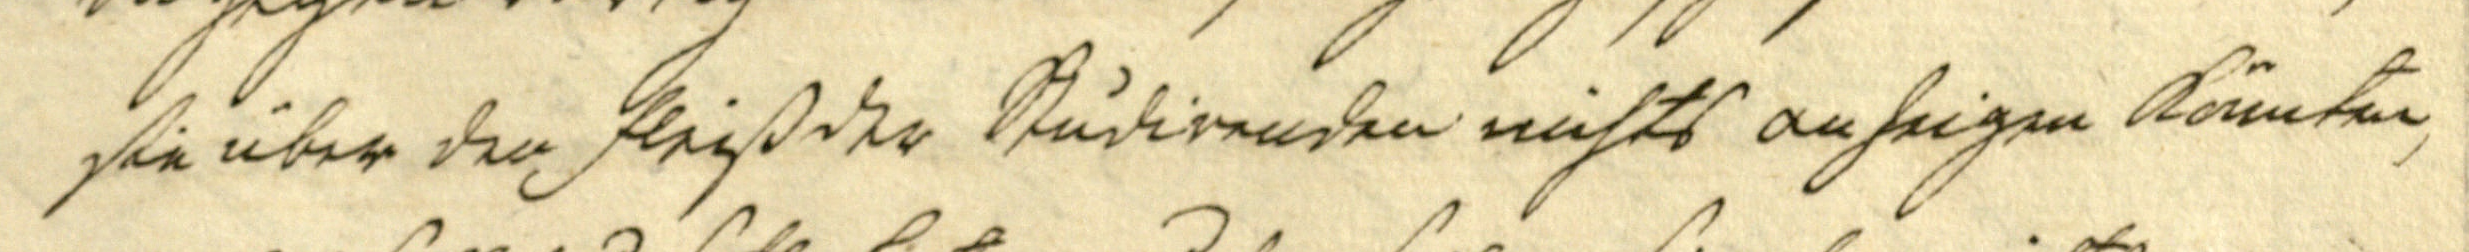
sie über der Fleiß der Studirenden nichts anzeigen könnten,
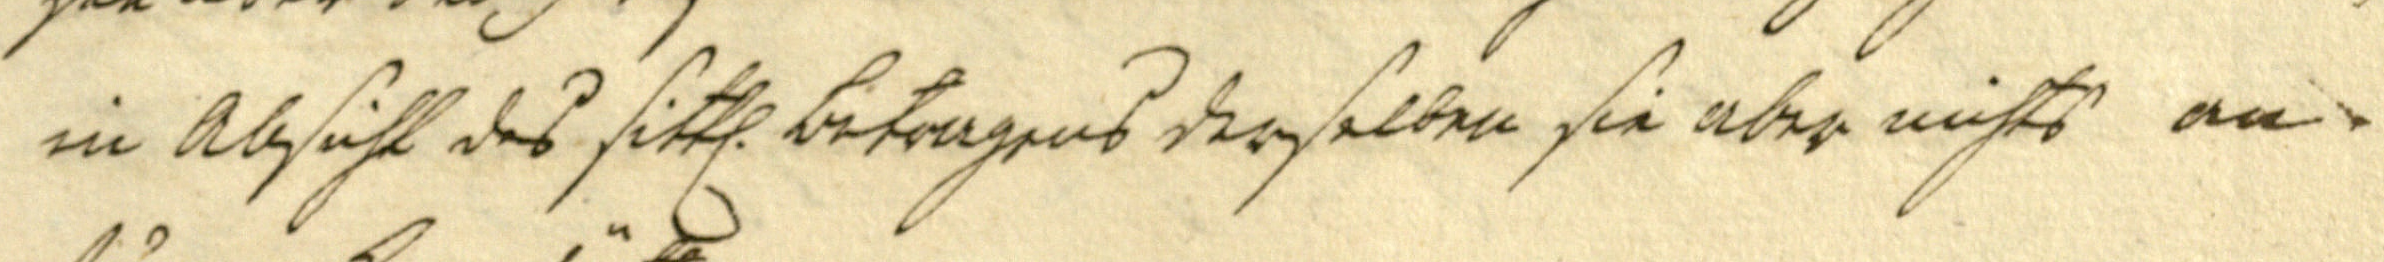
in Absicht des sittl. Betragens derselben sie aber nichts an¬
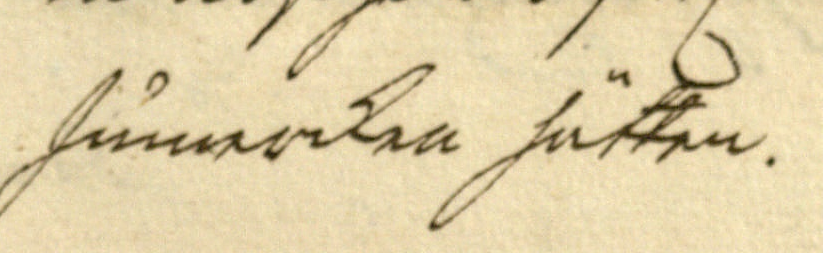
zumercken hätten.
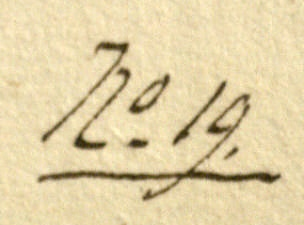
No 19.
